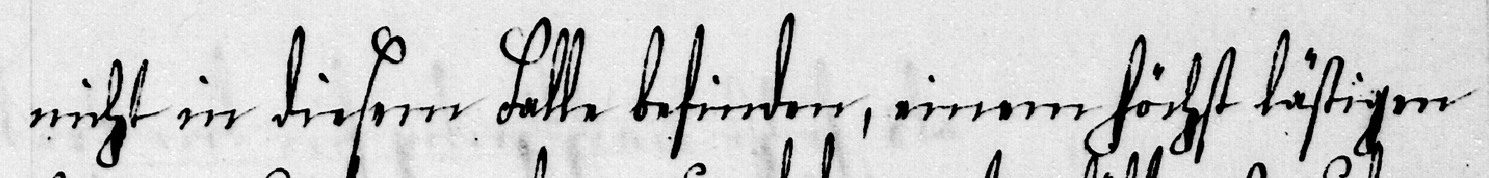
nicht in diesem Falle befinden, einem höchst lästigen
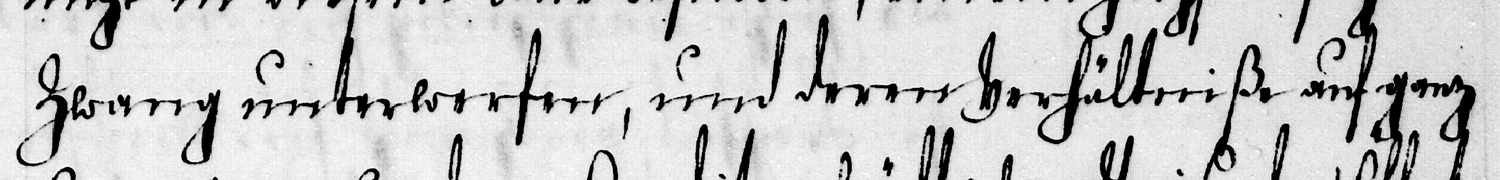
Zwang unterwerfen, und deren Verhältniße auf ganz
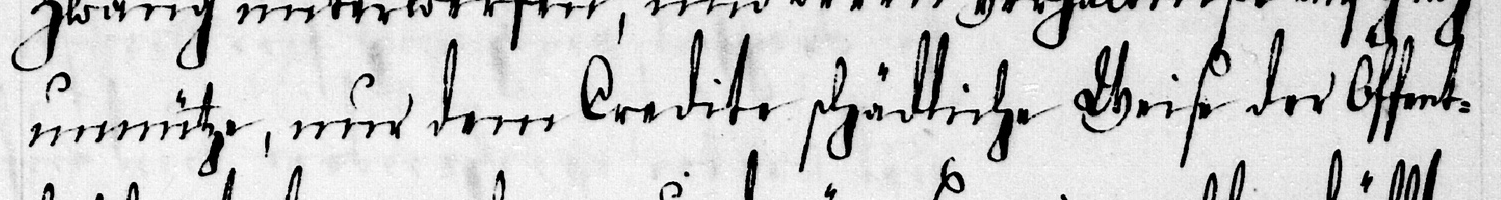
unnütze, nur dem Credite schädliche Weise der Öffen¬
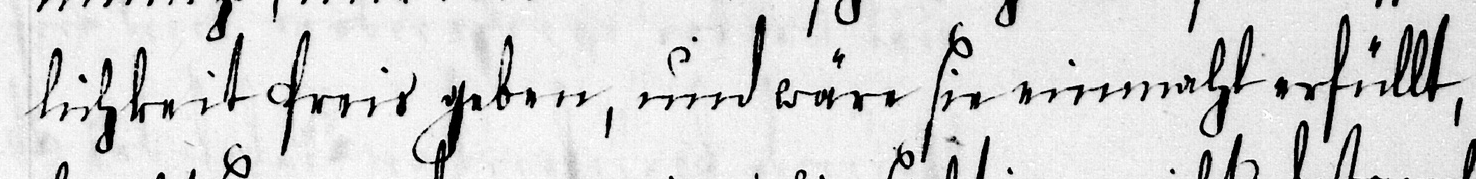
tlichkeit Preis geben, und wäre sie einmahl erfüllt,
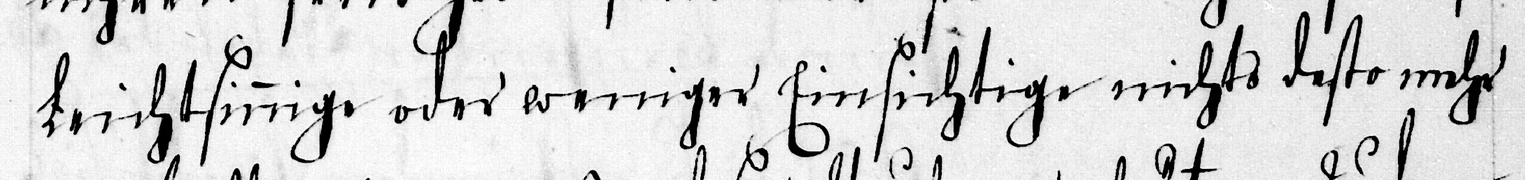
Leichtsinnige oder weniger Einsichtige nichts desto mehr
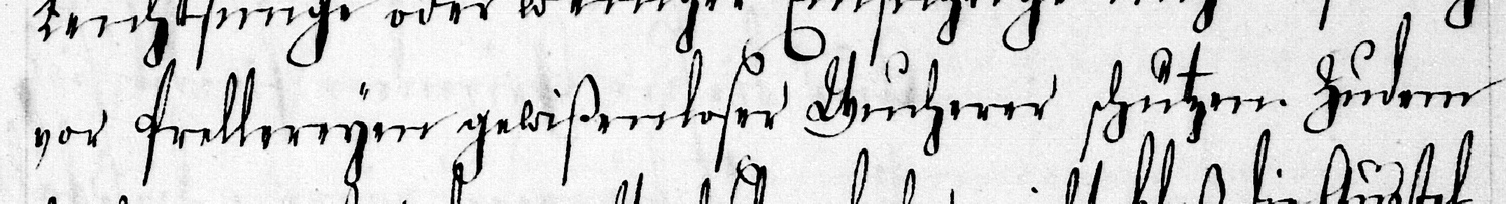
vor Prellereyen gewißenloser Wucherer schützen. Zudem
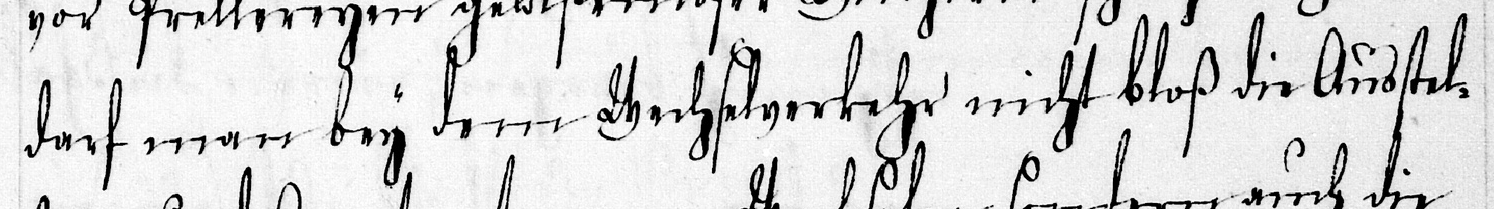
darf man bey dem Wechselverkehr nicht bloß die Ausstel¬
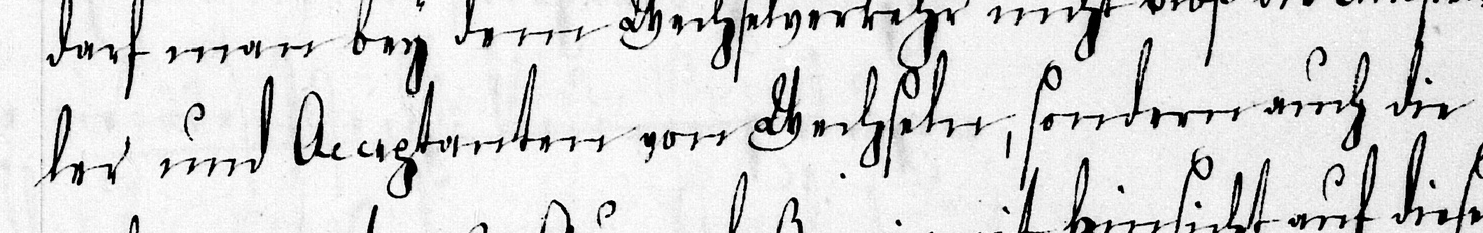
ler und Acceptanten von Wechseln, sondern auch die
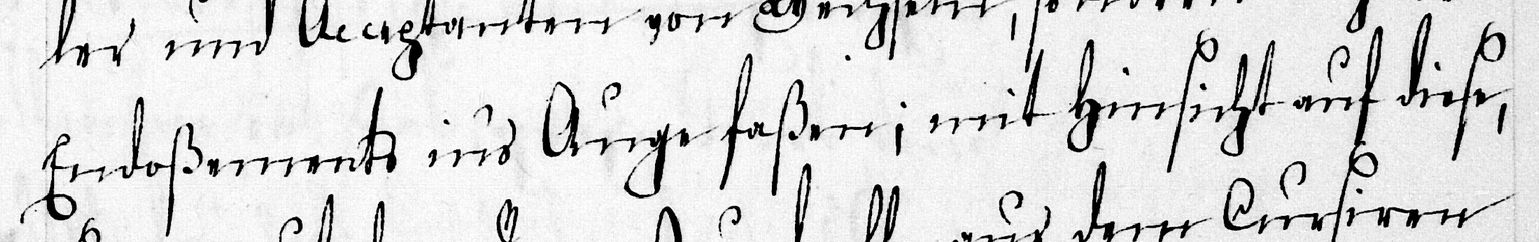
Endoßements ins Auge faßen; mit Hinsicht auf diese,
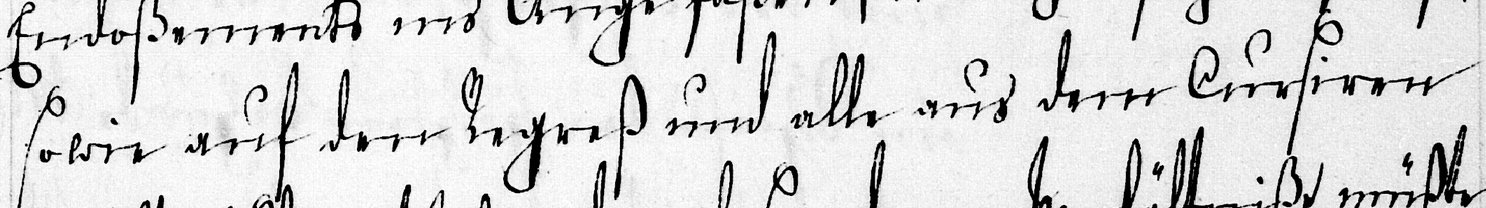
sowie auf den Regreß und alle aus dem Cursiren
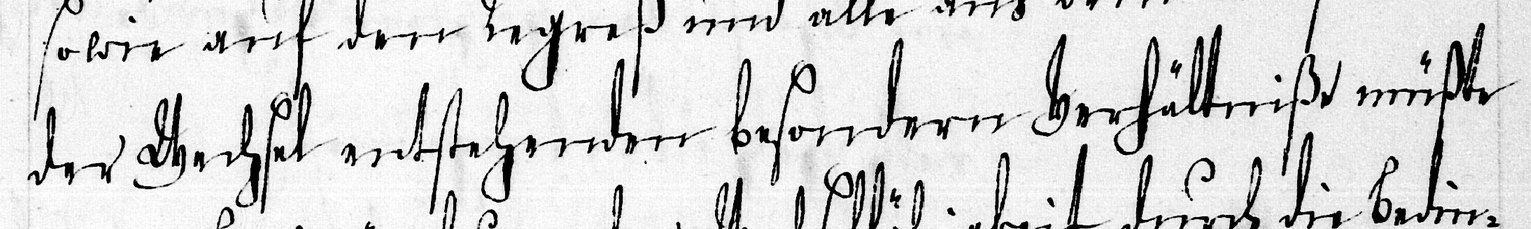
der Wechsel entstehenden besondern Verhältniße müßte
